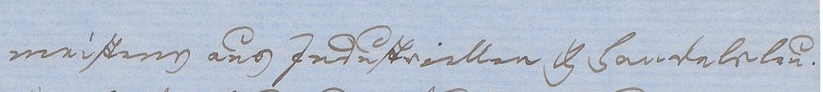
meistens aus Industriellen & Handelsleu-
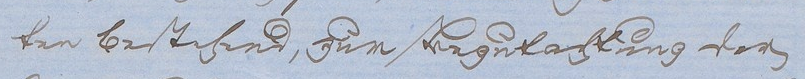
ten bestehend, zur Begutachtung der
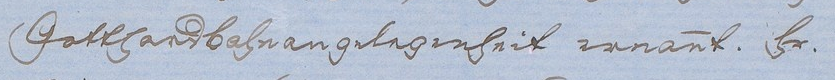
Gotthardbahnangelegenheit ernannt. Hr.
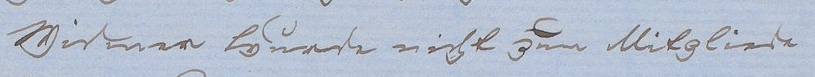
Widmer wurde nicht zum Mitgliede
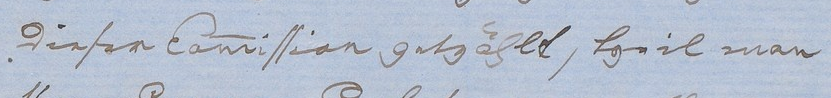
dieser Commission gewählt, weil man
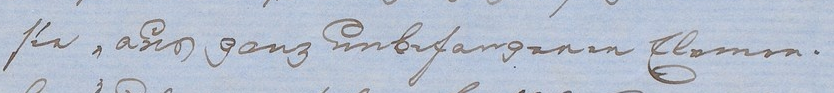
sie «aus ganz unbefangenen Elemen-
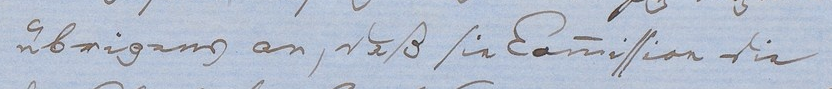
übrigens an, daß sie Commission die
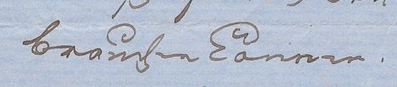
brauchen können.
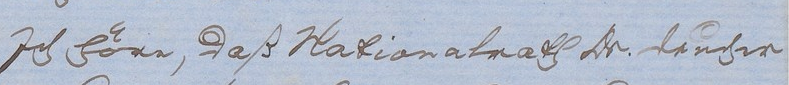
Ich höre, daß Nationalrath Dr. Deucher
